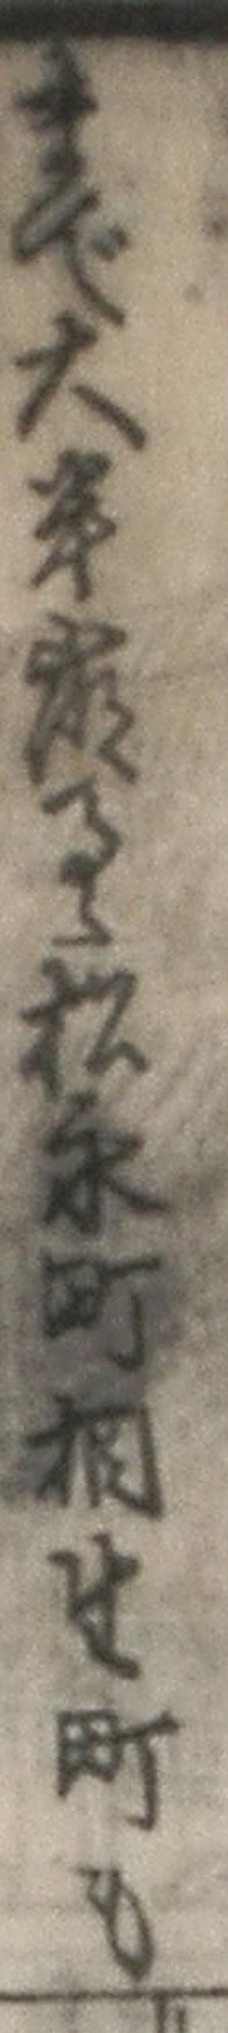まで大半崩るゝ松永町相生町も
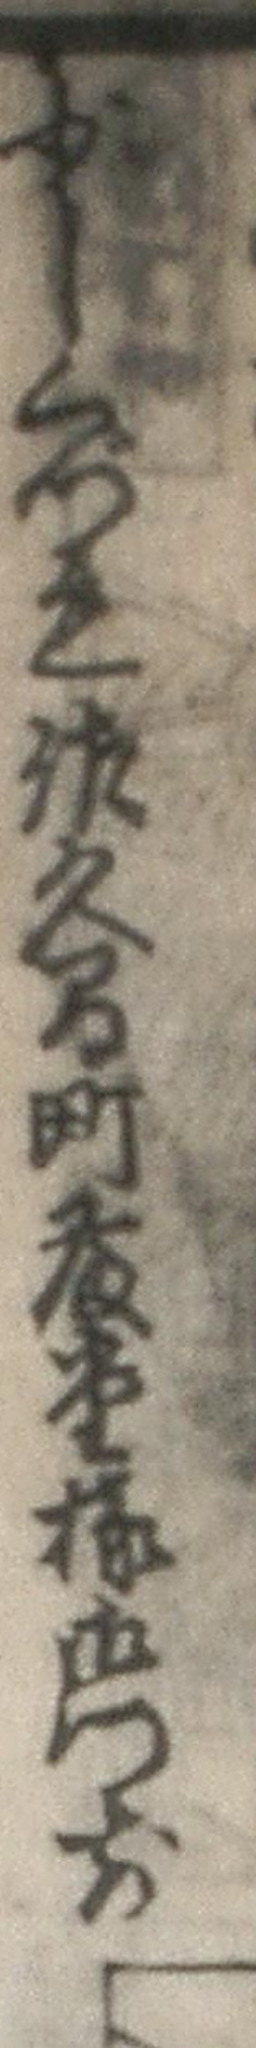少しくづれ佐久間町藤堂様御門前
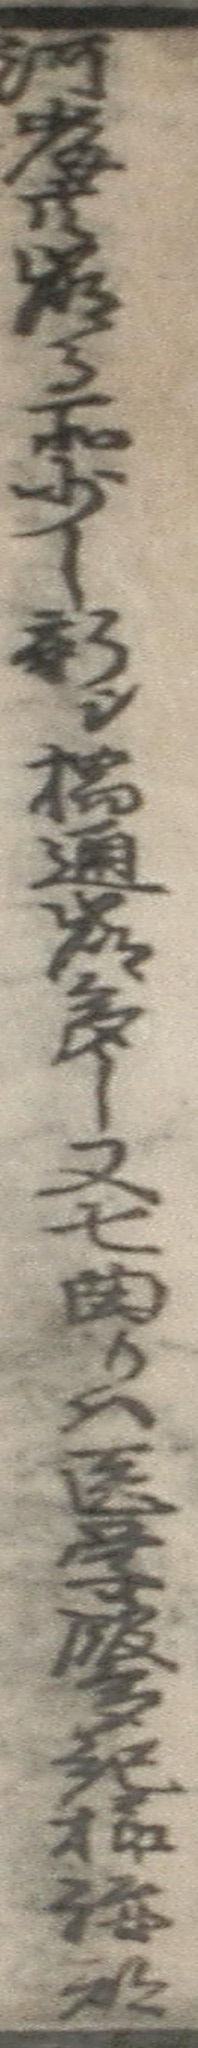河岸共崩る所少し新し橋通崩多し又七曲りは医学館多紀様海部
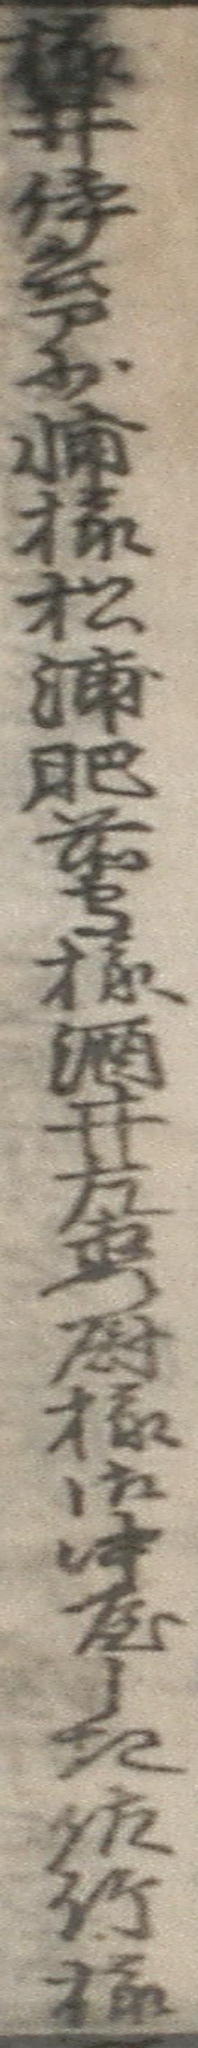様井伊兵部少輔様松浦肥前様酒井左衛門尉様御中屋しき佐竹様
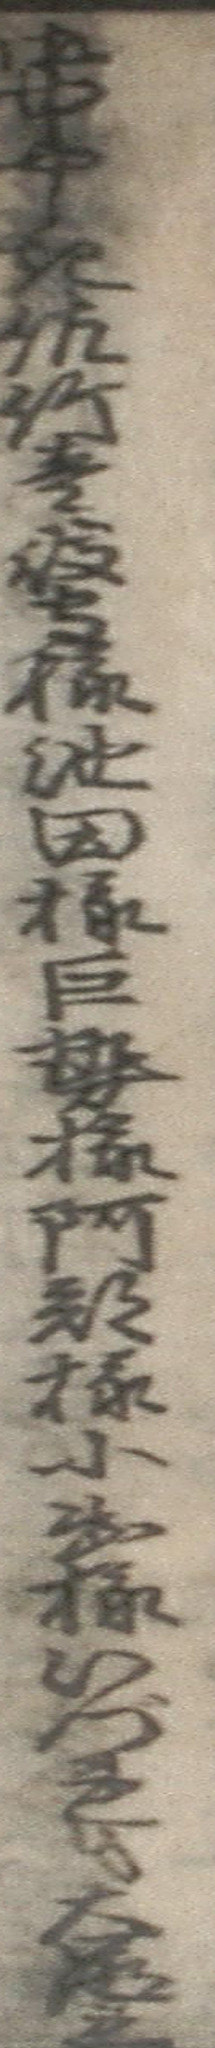御中やしき佐竹壱岐様池田様巨㔟様阿部様小出様いづれも大崩れ
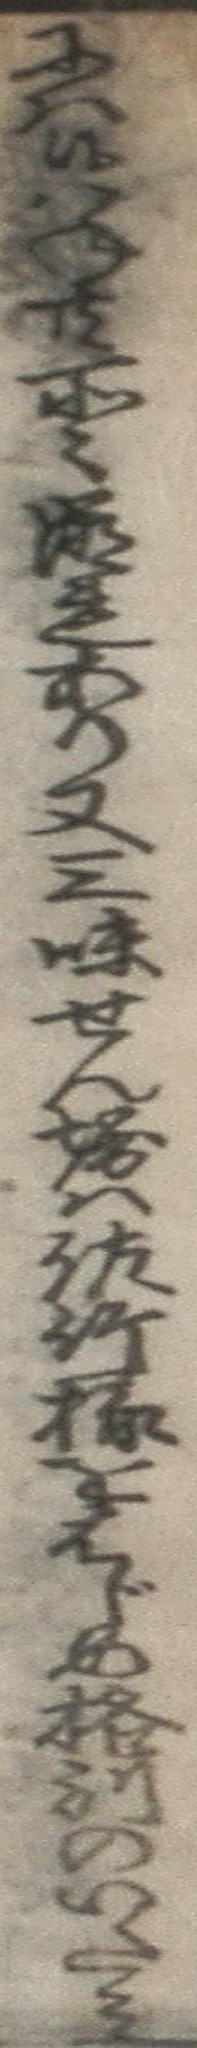には候はね共所〻崩れあり又三味せん堀は佐竹様をはじめ格別のいたみ
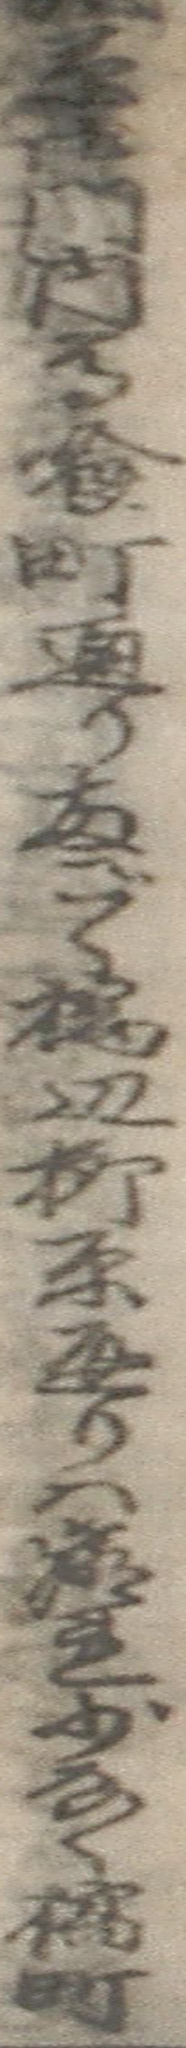九浅草御門内馬喰町通り両ごく橋辺柳原通りは崩れ少なく橋町
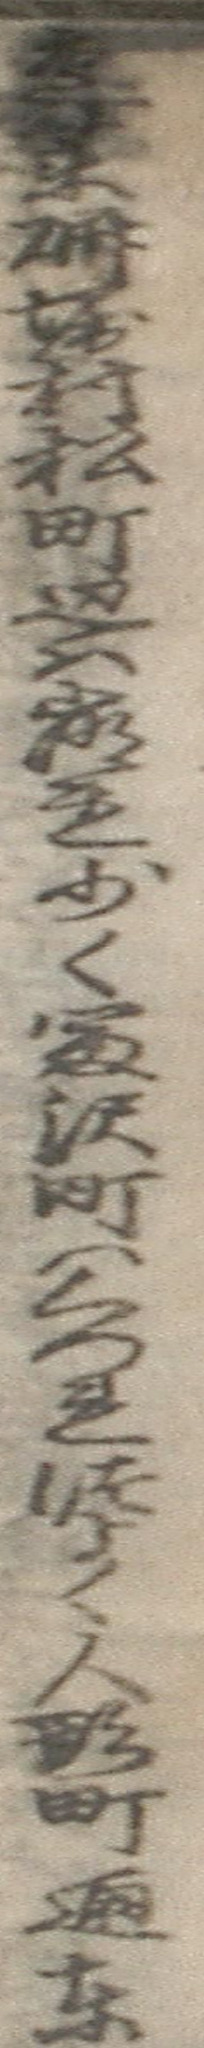辺薬研堀村松町辺は崩れ少く冨沢町はくつれつよく人形町通東
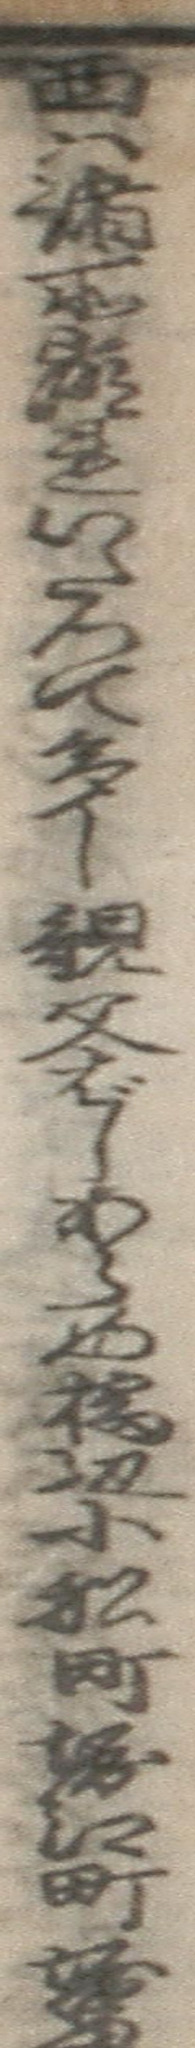西は諸所崩れいたつて多し親父ばしあらめ橋辺は小船町堀江町堀留
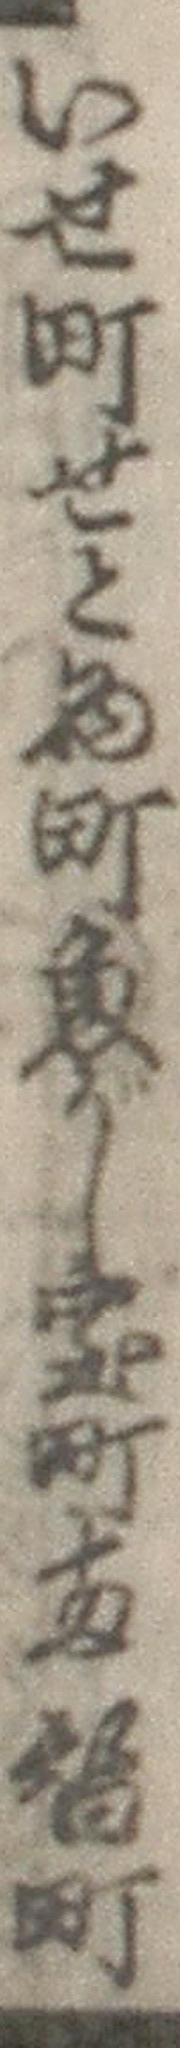いせ町せと物町魚がし宝町両替町
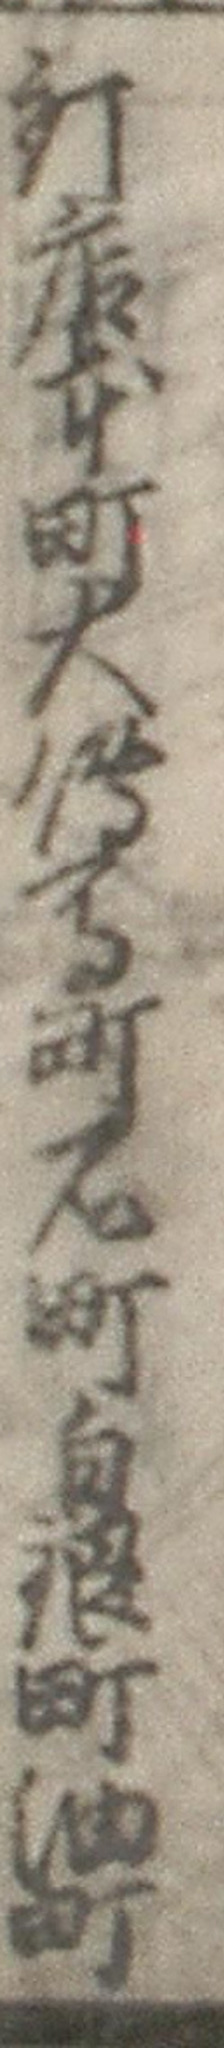釘店本町大伝馬町石町白銀町油町
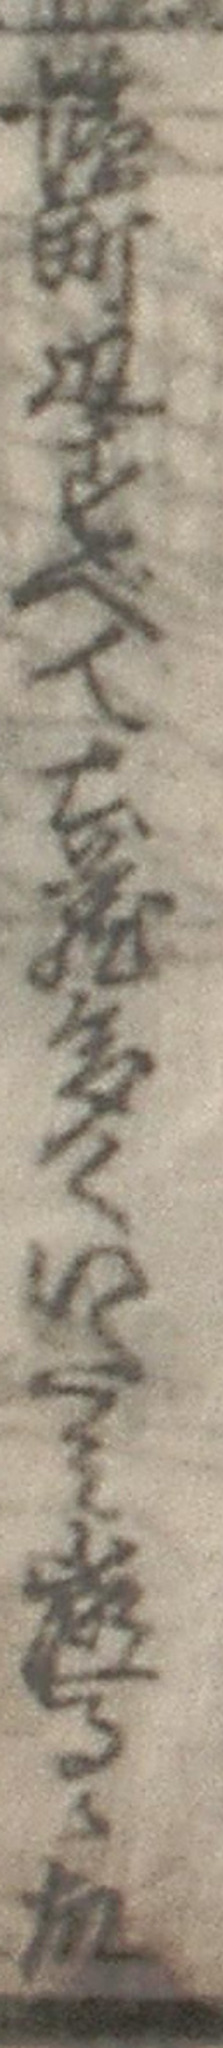塩町辺すべて土蔵多くいたみ崩るゝ故
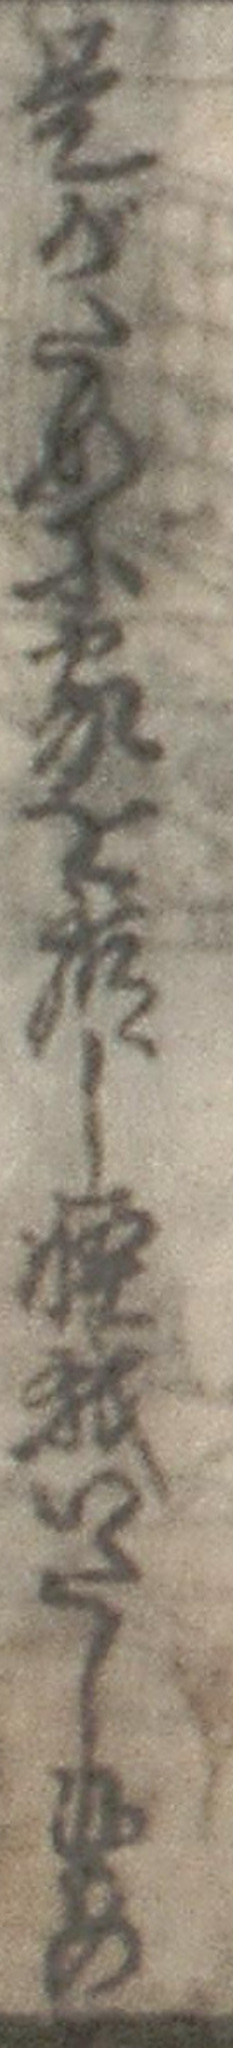是がために家を崩し怪我いたし候もの

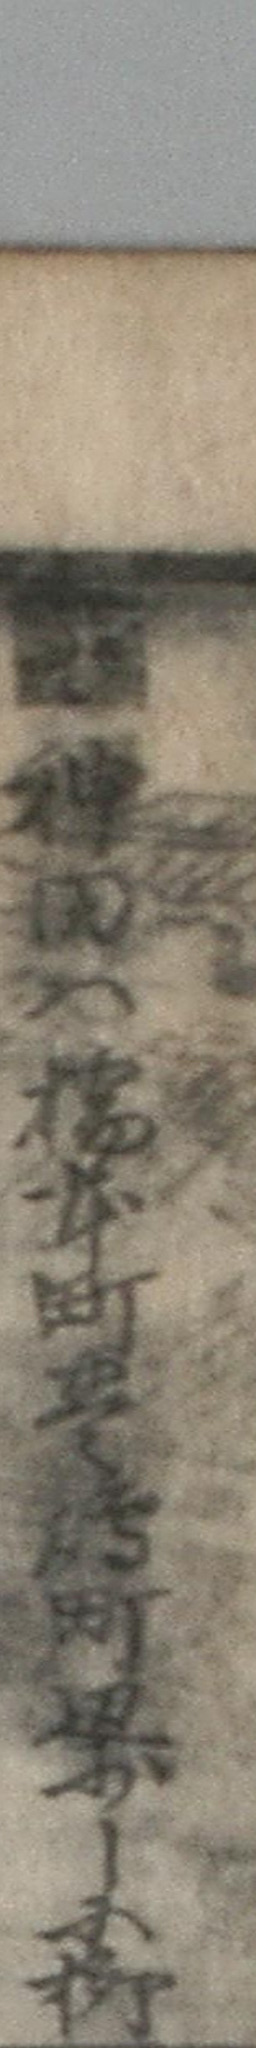十神田は橋本町豊嶋町辺少し小柳
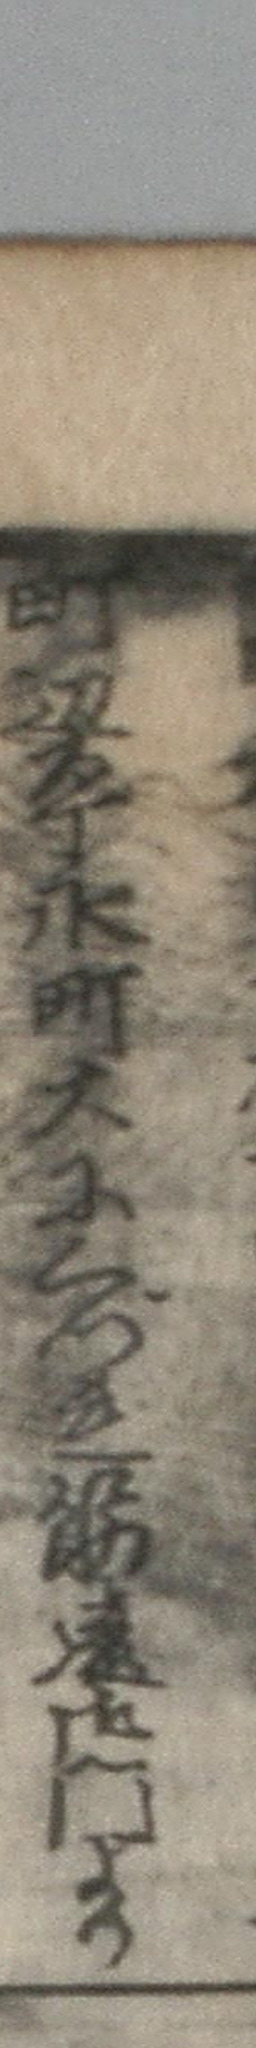町辺平永町大にくづれ筋違御門より
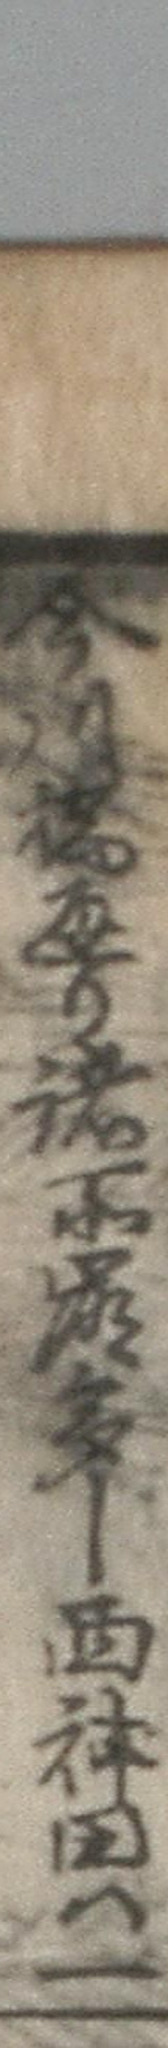今川橋通り諸所崩多し西神田は一
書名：江戸大地震末代鑑
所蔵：東京大学地震研究所図書室 Earthquake Research Institute Library, The University of Tokyo, JAPAN
